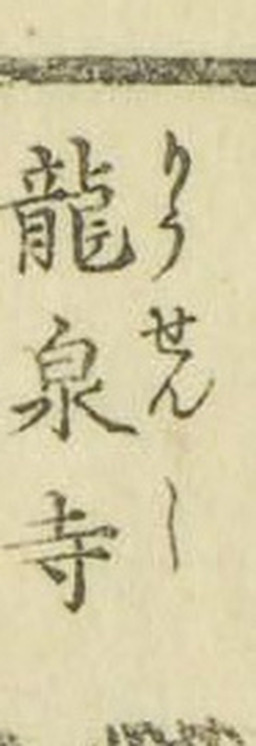龍泉寺
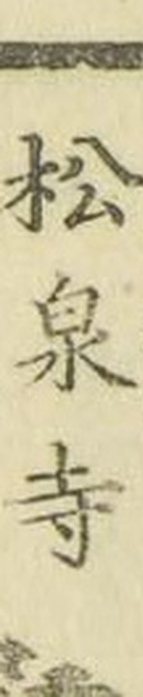松泉寺
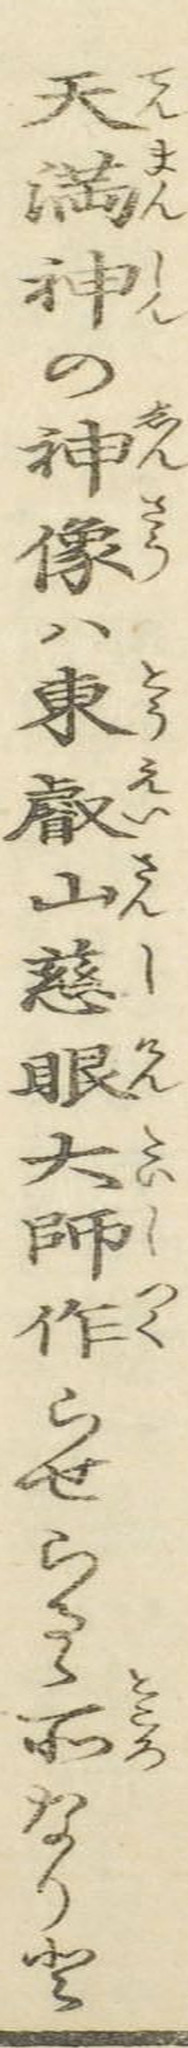天満神の神像は東叡山慈眼大師作らせらるゝ所なりと
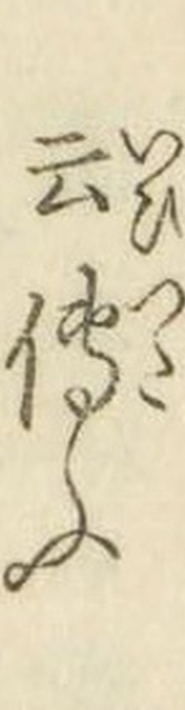云傳ふ
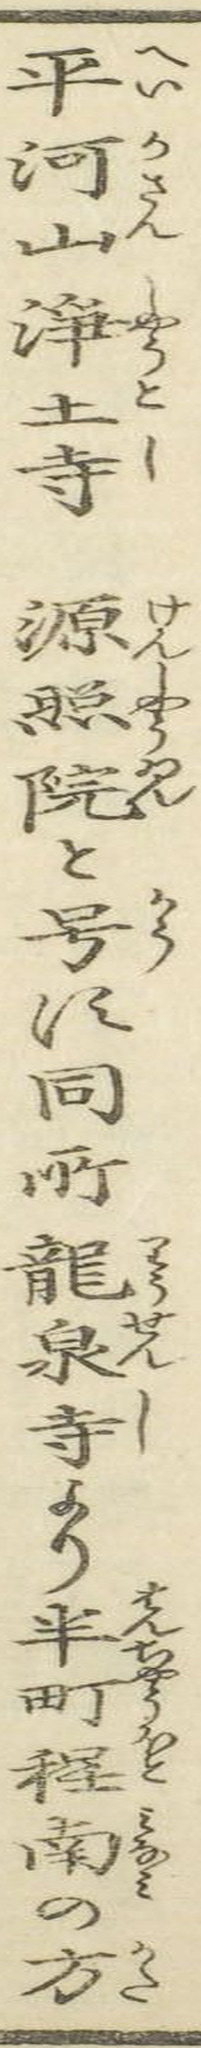平河山淨土寺源照院と号す同所龍泉寺より半町程南の方
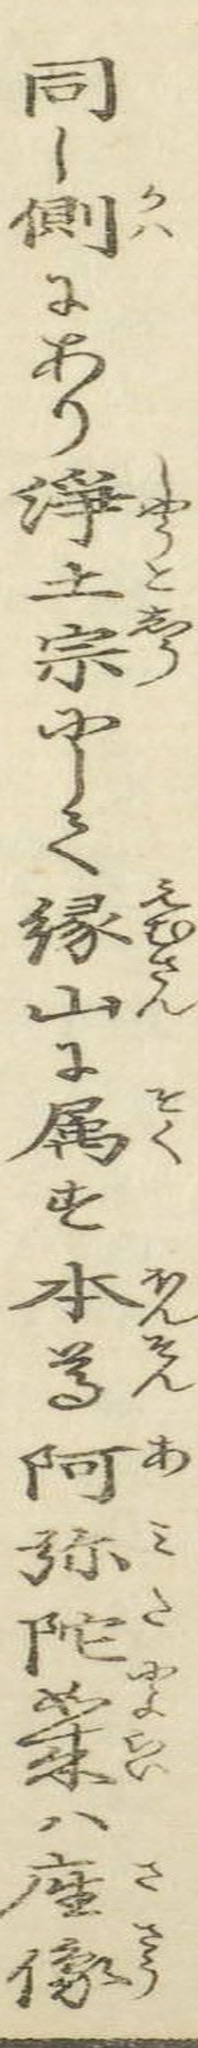同し側にあり淨土宗にして縁山に属す本尊阿弥陀如来は座像
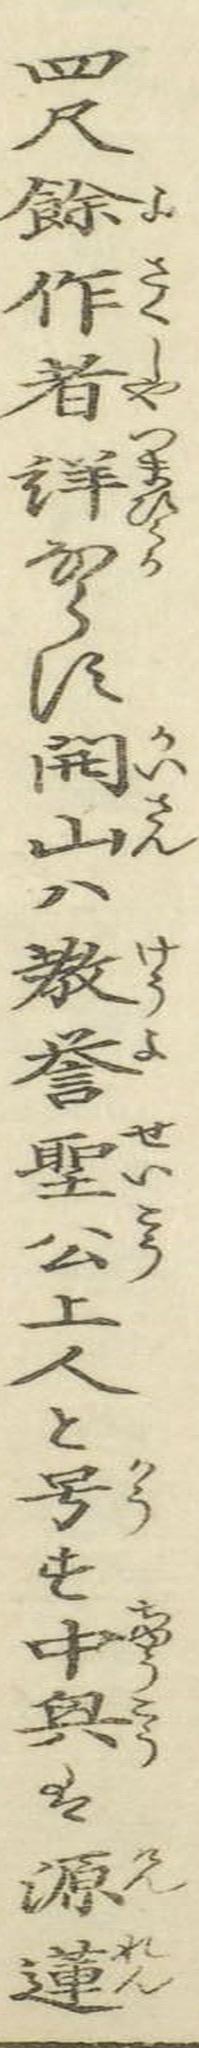四尺餘作者詳ならす開山は教誉聖公上人と号す中興は源蓮
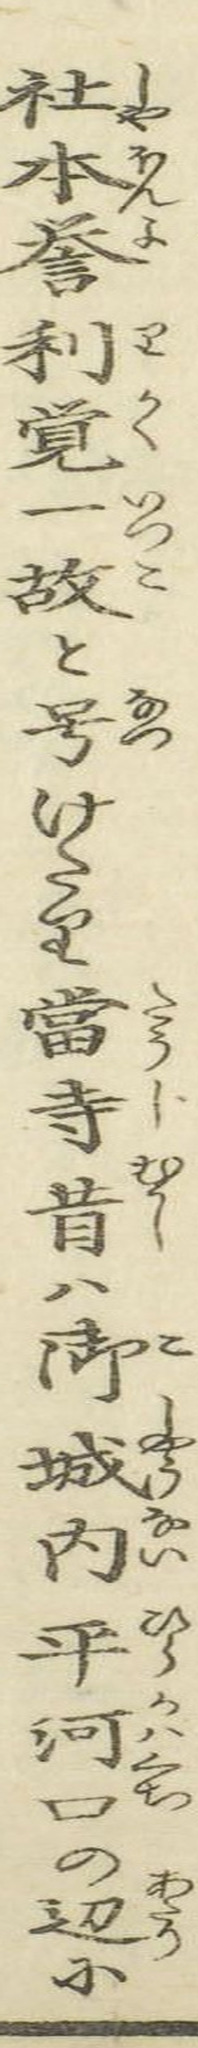社本誉利覚一故と号けたり當寺昔は御城内平河口の辺に
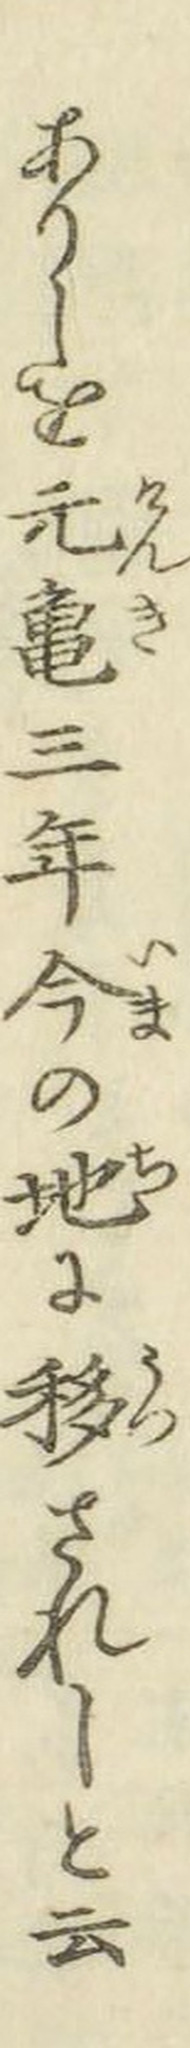ありしを元亀三年今の地に移されしと云
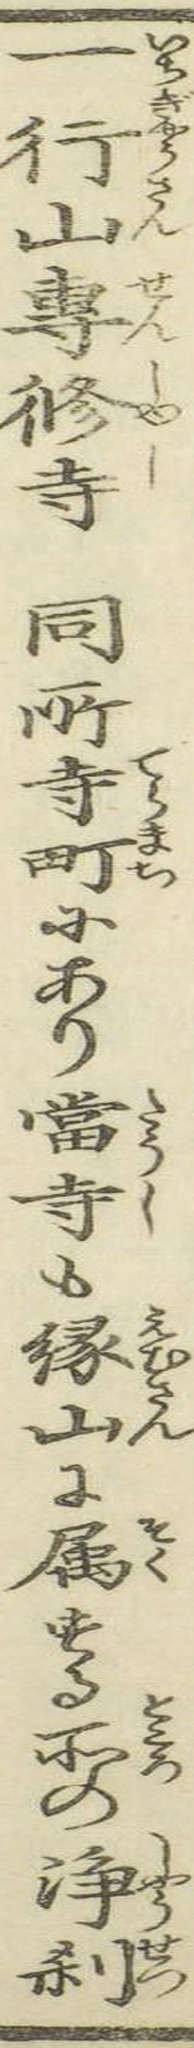一行山專修寺同所寺町にあり當寺も縁山に属する所の淨刹
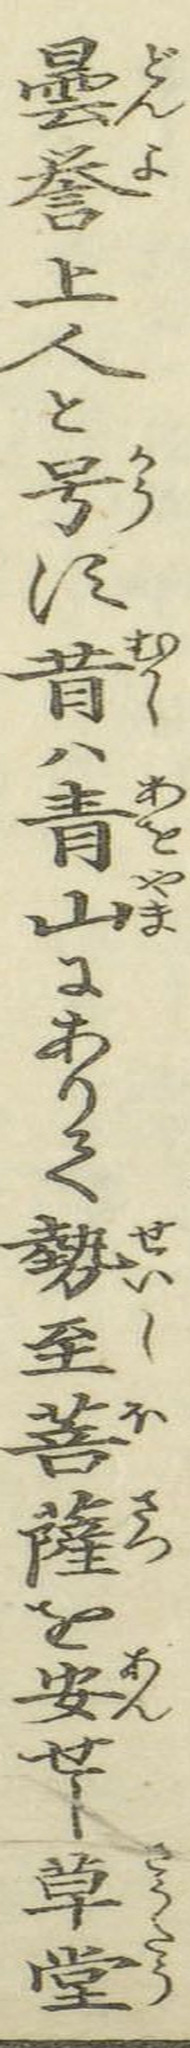曇誉上人と号す昔は青山にありて勢至菩薩を安せし草堂
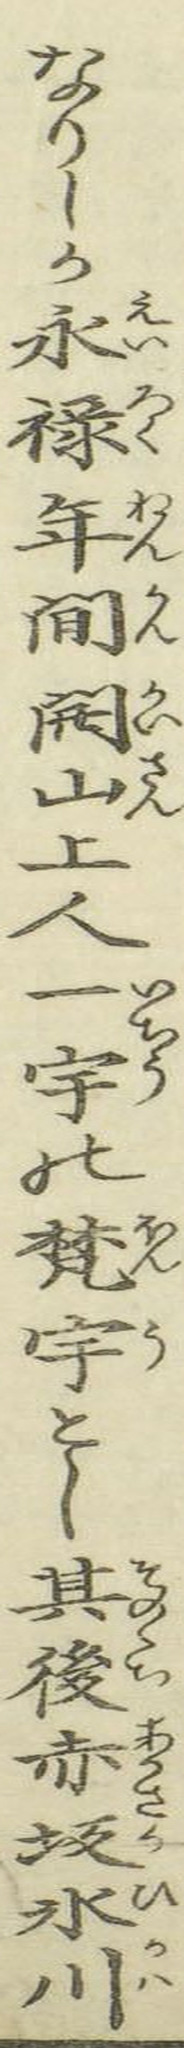なりしか永年間禄開山上人一宇の梵宇とし其後赤坂氷川
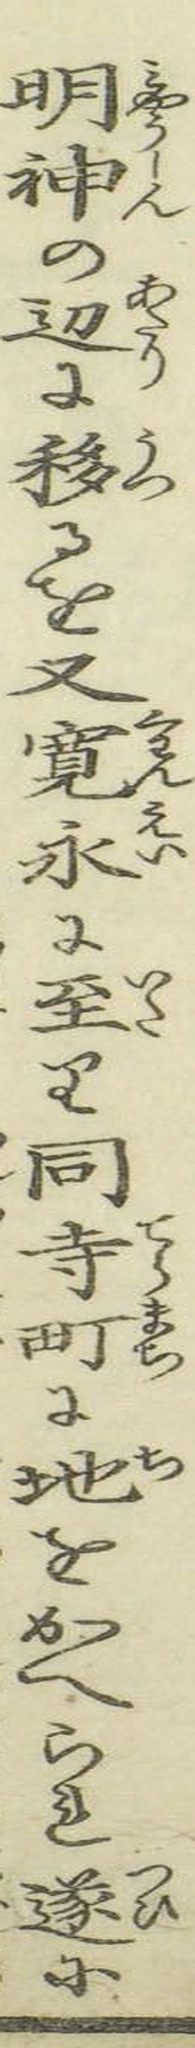明神の辺に移るを又寛永に至り同寺町に地をかへられ遂に

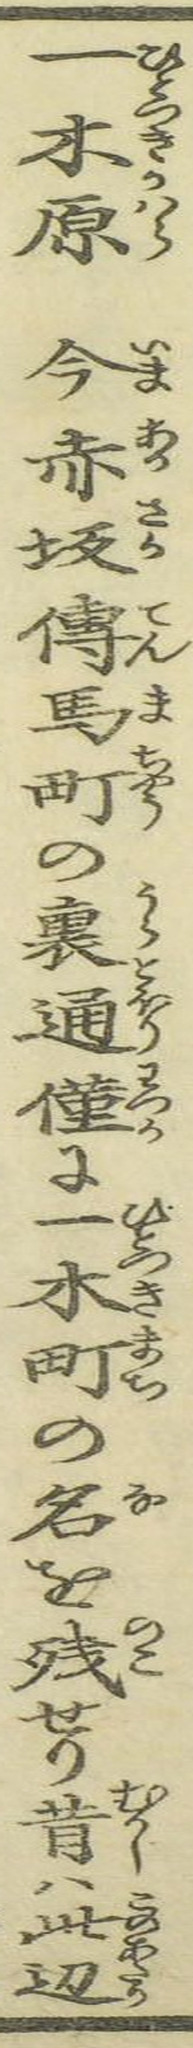一木原今赤坂傳馬町の裏通僅に一木町の名を残せり昔は此辺
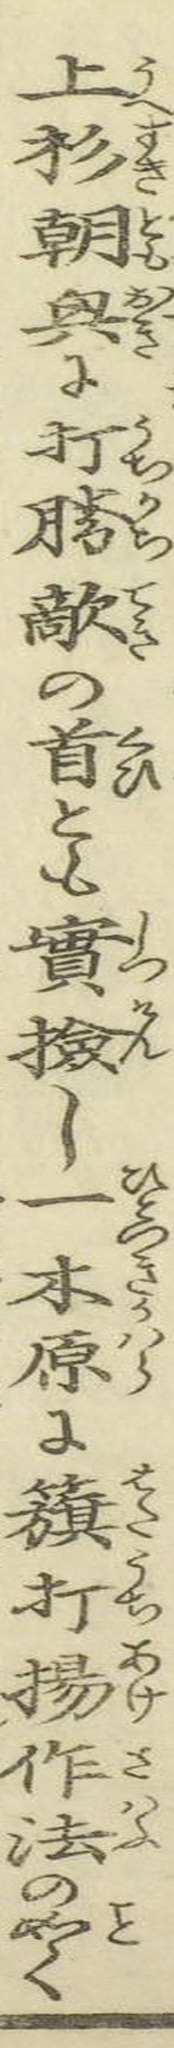上杉朝興に打勝歒の首とも實撿し一木原に籏打揚作法の如く
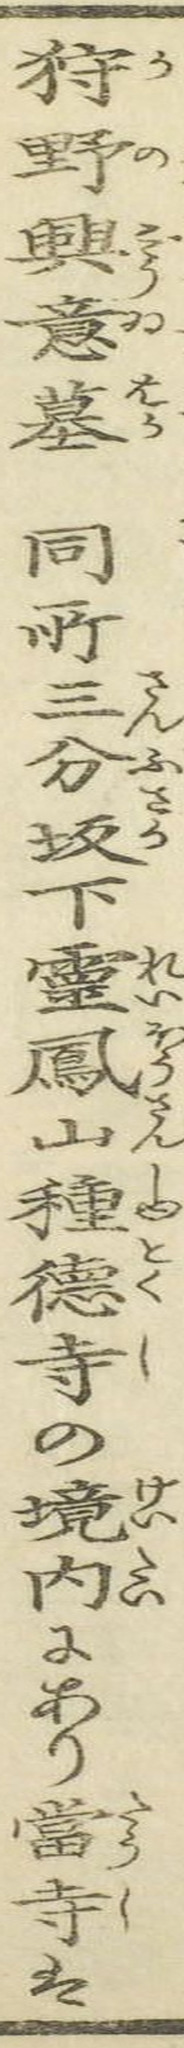加野興意墓同所三分坂下靈鳳山種德寺の境内にあり當寺は
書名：江戸名所図会 20巻 巻之8
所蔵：東京学芸大学教育コンテンツアーカイブ
